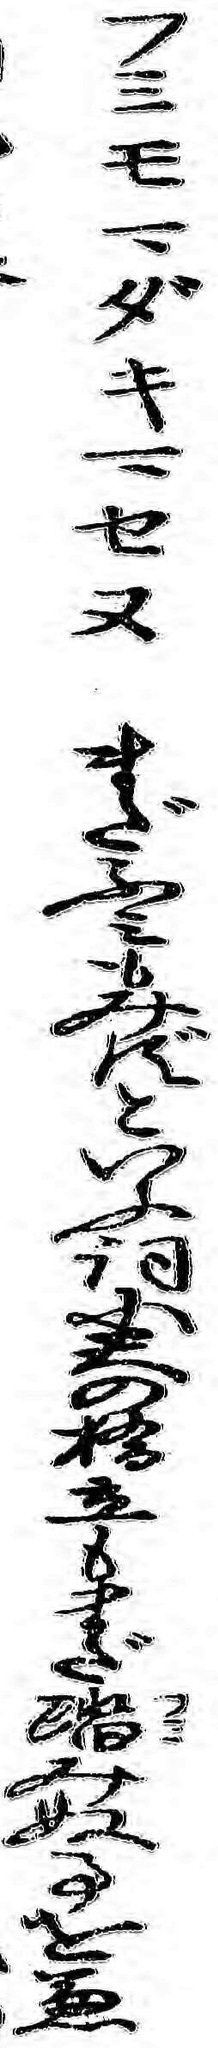フミモマダキマセヌまだふみもみずという詞に天の橋立もまだ踏みぬ事を兼たり
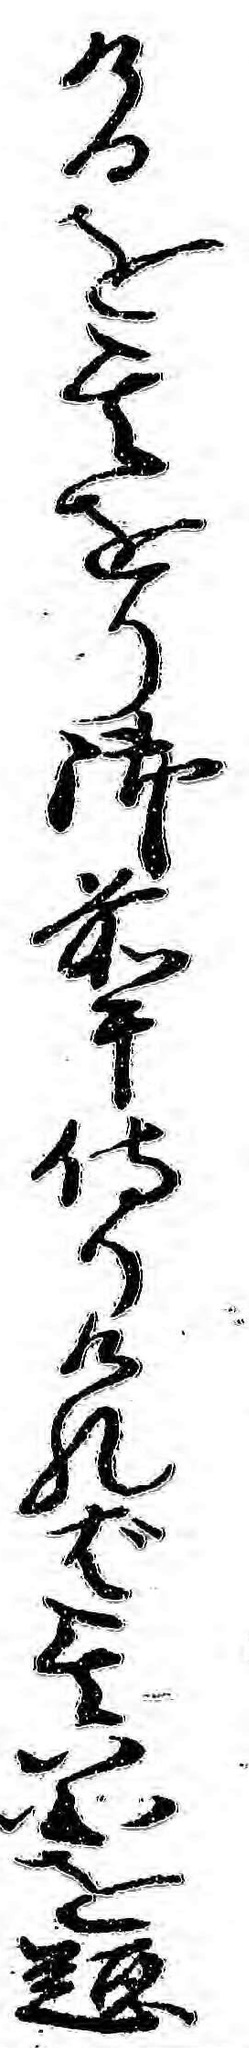けるを其をり御前に侍りければ其花を題
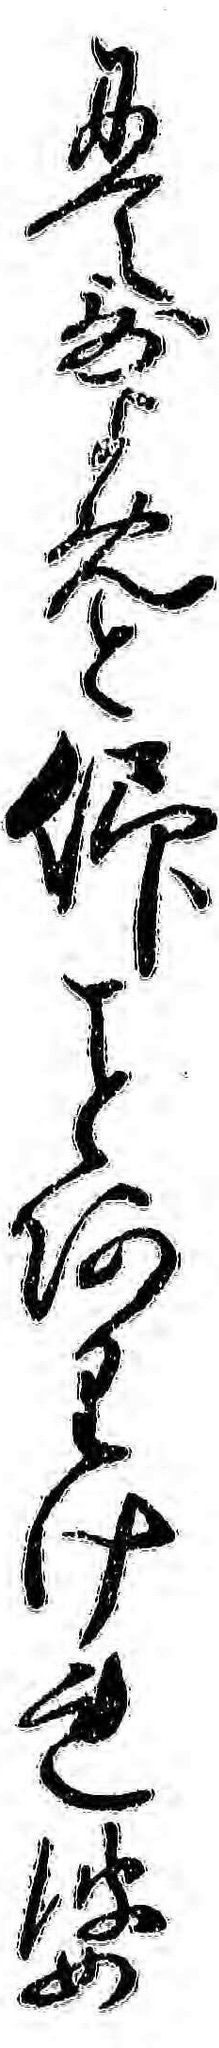にて哥よめと仰ことありければ
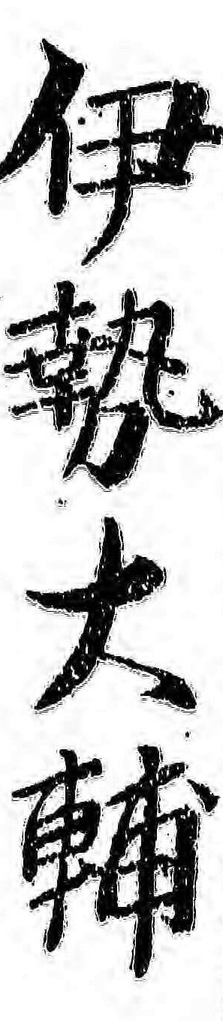伊勢大輔
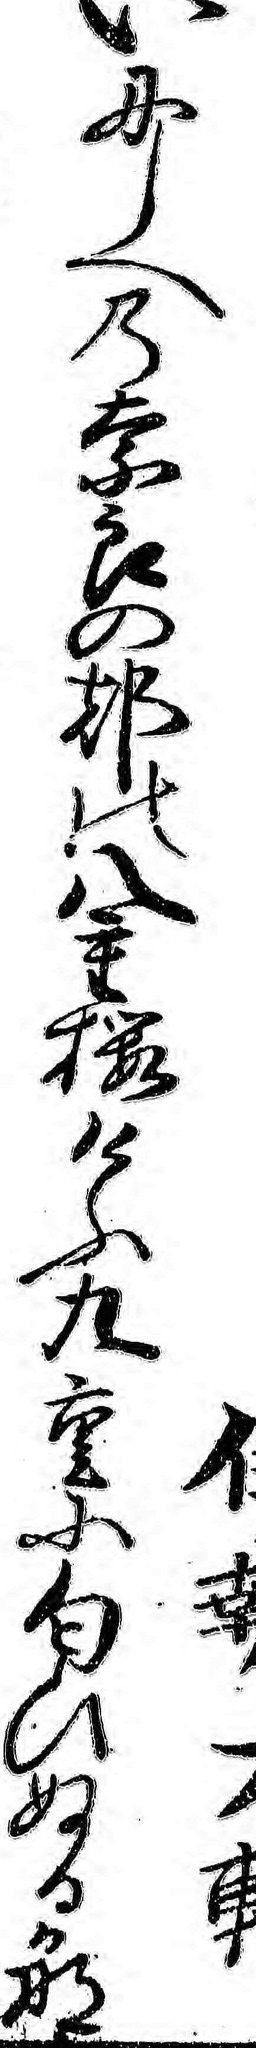いにしへの奈良の都の八重桜けふ九重に匂ひぬるかな
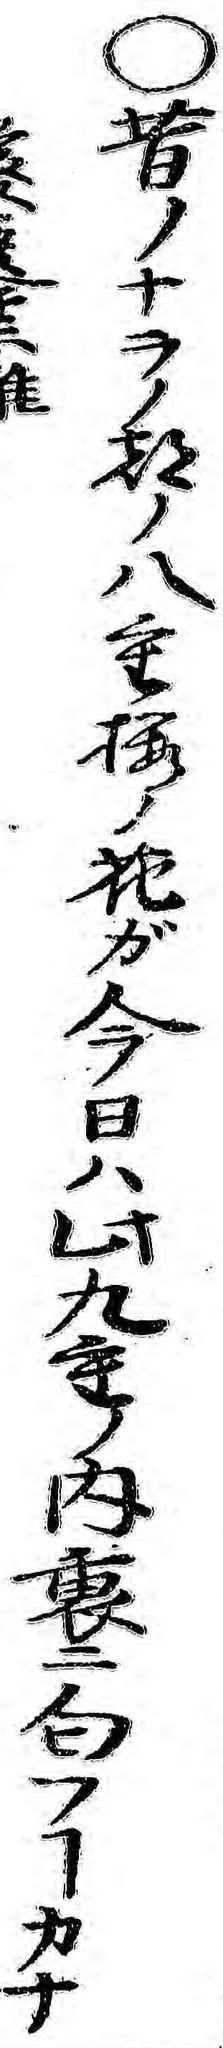○昔ノナラノ都ノ八重桜ノ花ガ今日ハ此九重ノ内裏ニ匂フコトカナ
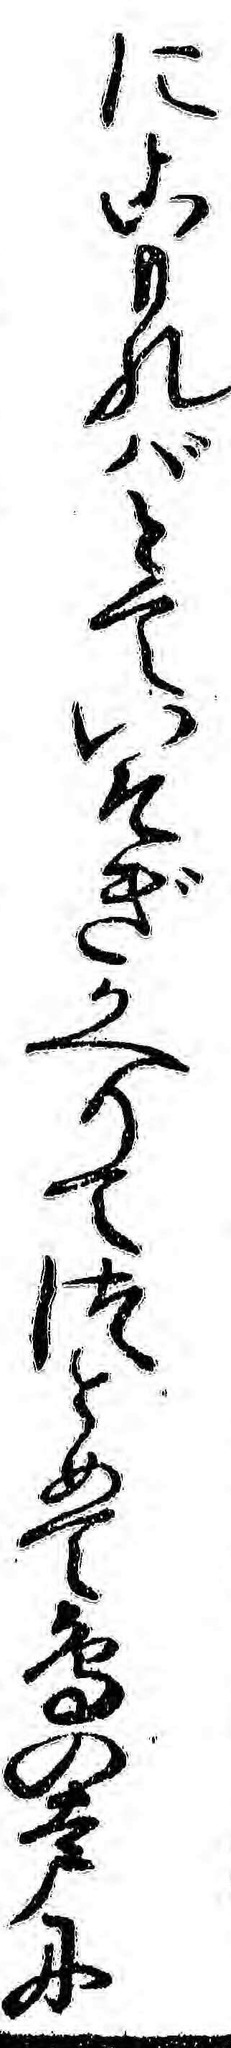にこもればとていそぎかへりてつとめて鳥の声に
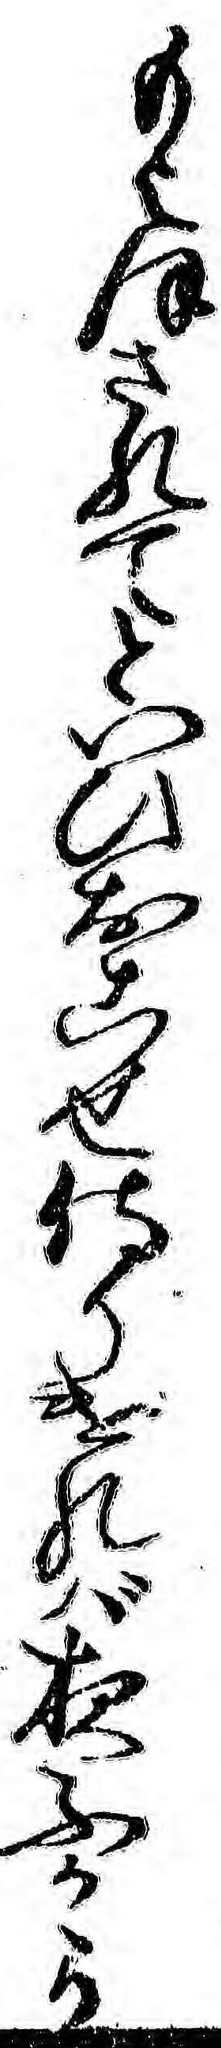もよほされてといひおこせ侍りければ夜ふかゝり
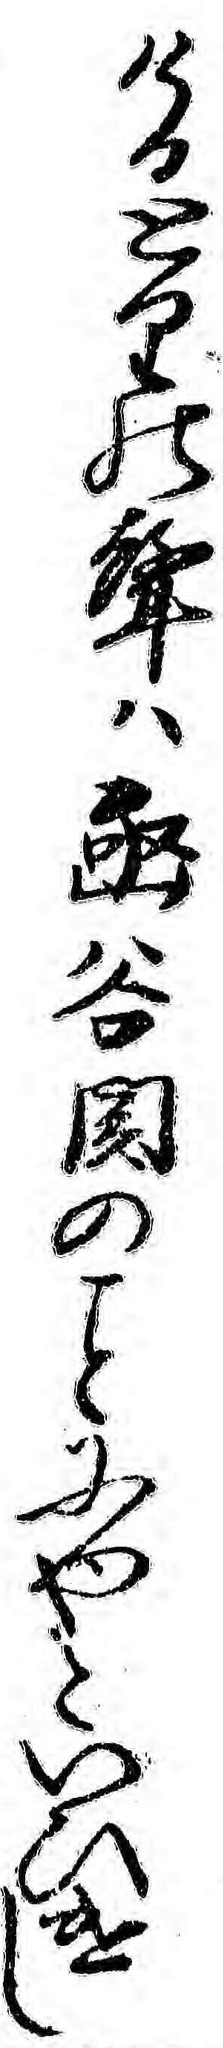けるとりの声は函谷関のことにやといひ遣し
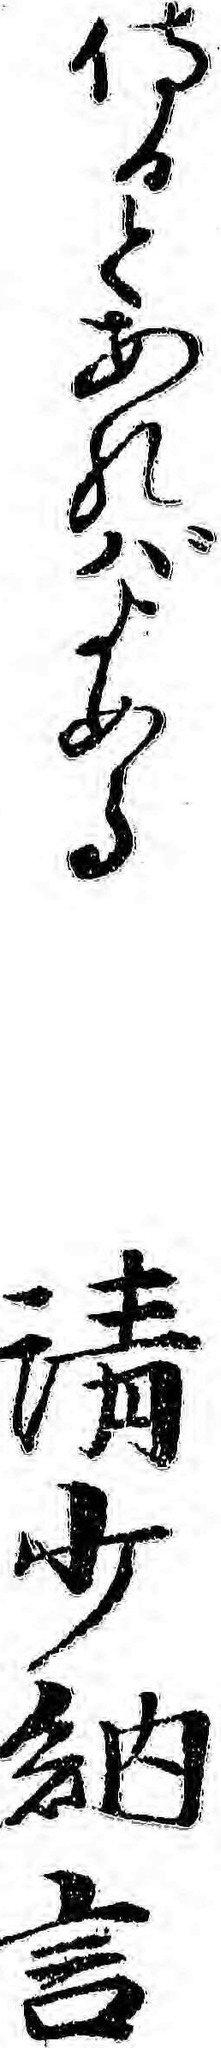侍るとあればよめる清少納言
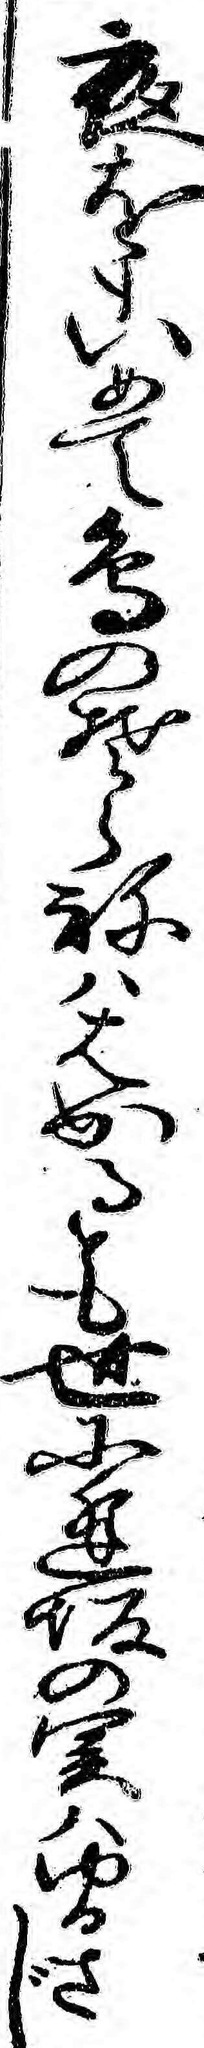夜をこめて鳥のそらねははかるとも世に逢坂の関はゆるさじ

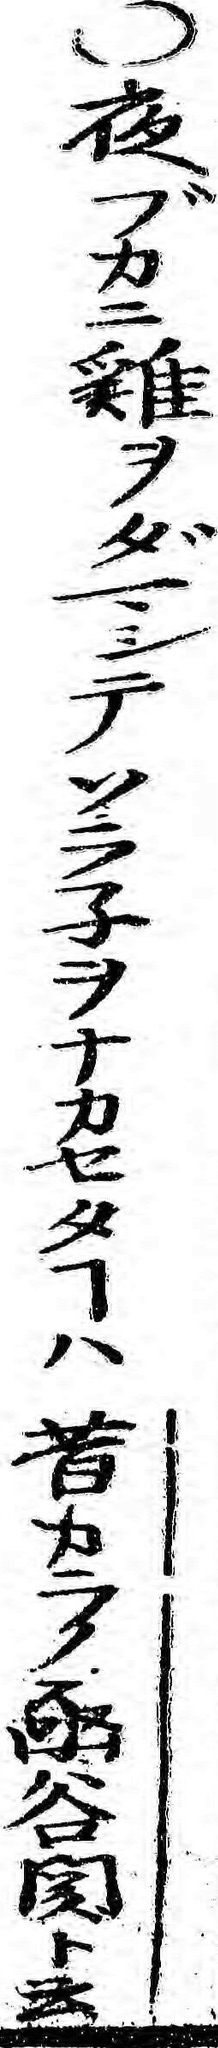○夜ブカニ鶏ヲダマシテソラネヲナカセタコトハ昔カラノ函谷関ト云
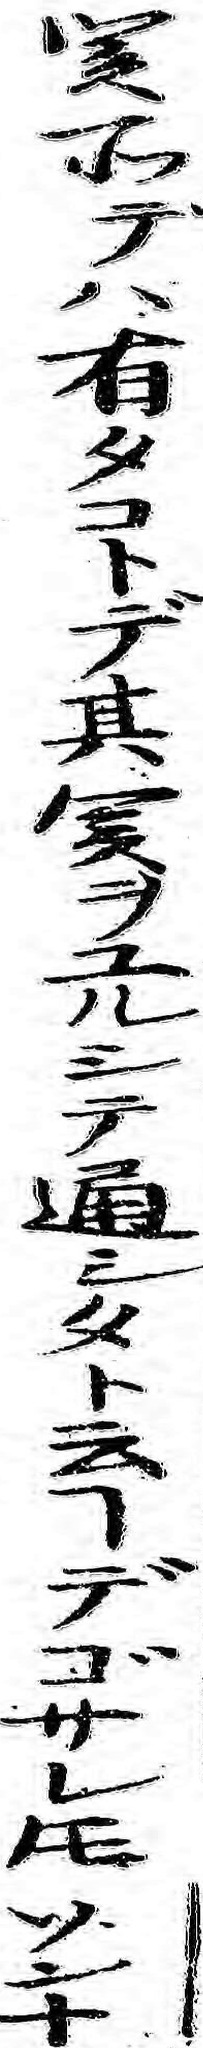関所デハ有タコトデ其関ヲユルシテ通シタト云コトデゴサレトモソンナ
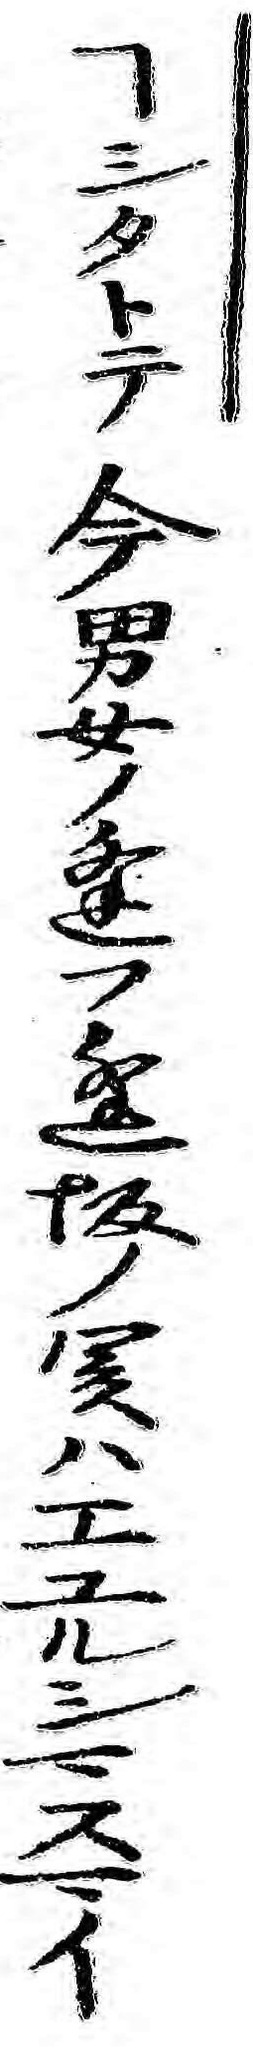コトシタトテ今男女ノ逢フ逢坂ノ関ハエユルシマスマイ
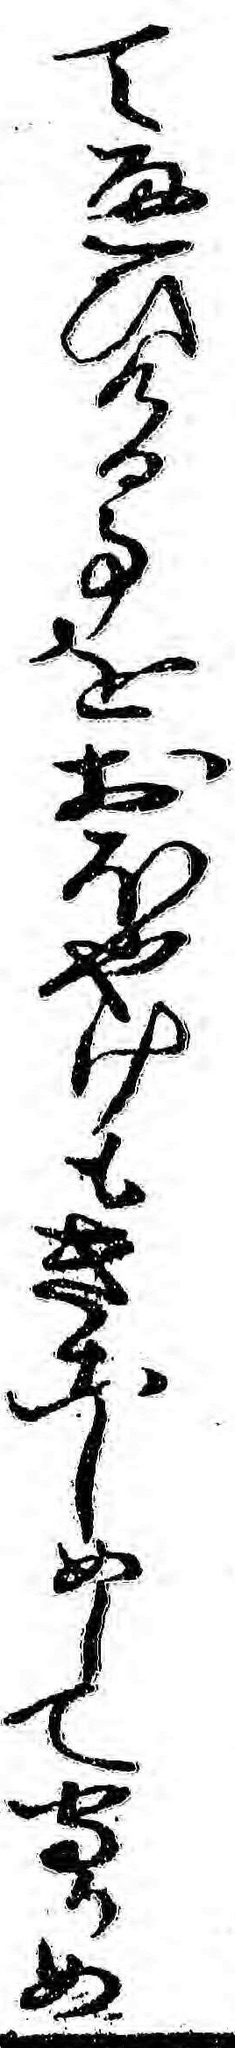て通ひける事をおほやけもきこしめして守りめ
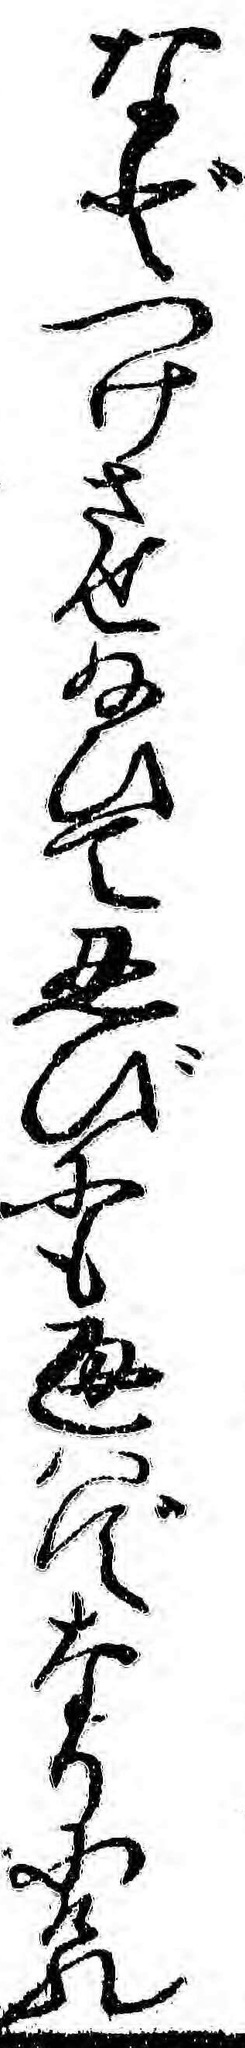などつけさせ給ひて忍びにも通はずなりにけれ
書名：百人一首／小倉の山ふみ
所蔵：国文学研究資料館
